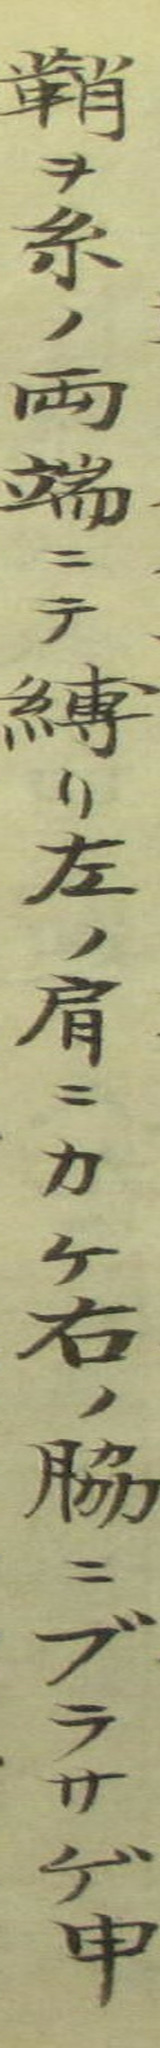鞘ヲ糸ノ両端ニテ縛リ左ノ肩ニカケ右ノ脇ニブラサゲ申
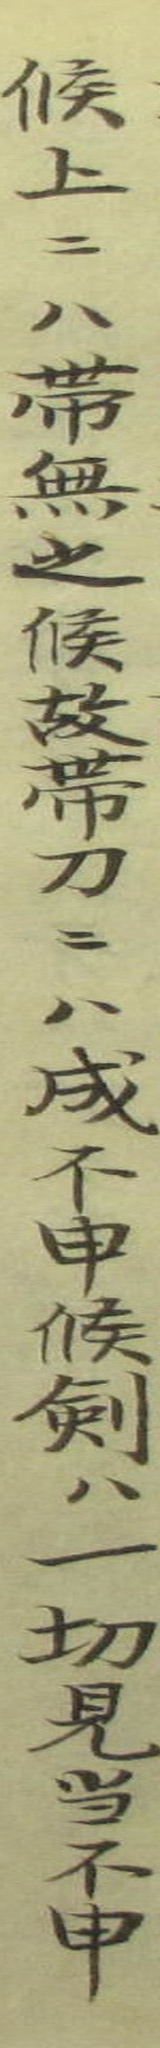候上ニハ帯無之候故帯刀ニハ成不申候剣ハ一切見当不申
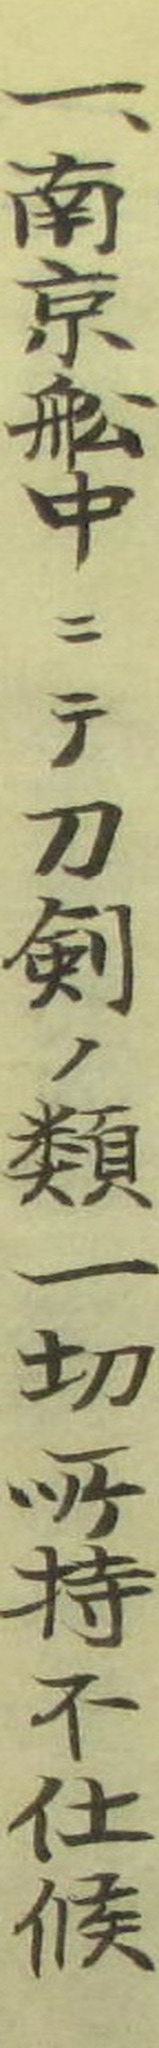一南京舩中ニテ刀剣ノ類一切所持不仕候
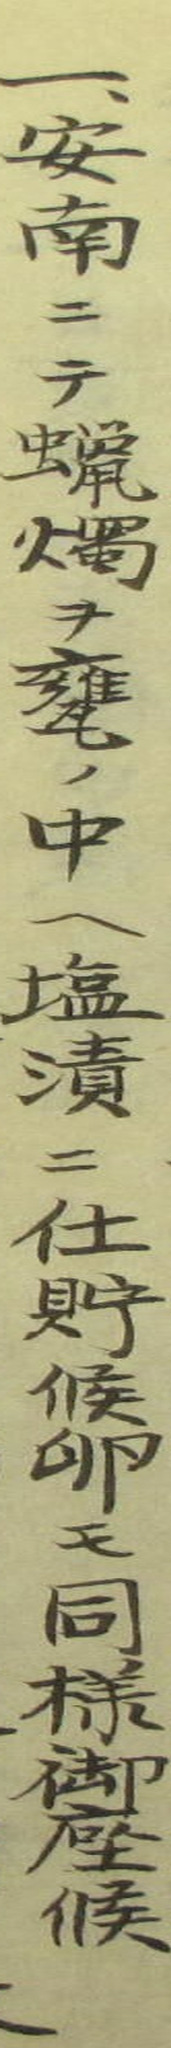一安南ニテ蝋燭ヲ甕ノ中ヘ塩漬ニ仕貯候卵モ同様御座候
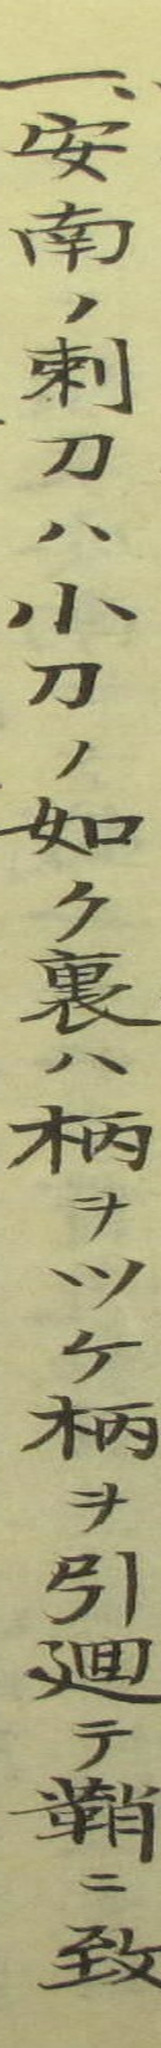一安南ノ刺刀ハ小刀ノ如ク裏ハ柄ヲツケ柄ヲ引廻テ鞘ニ致
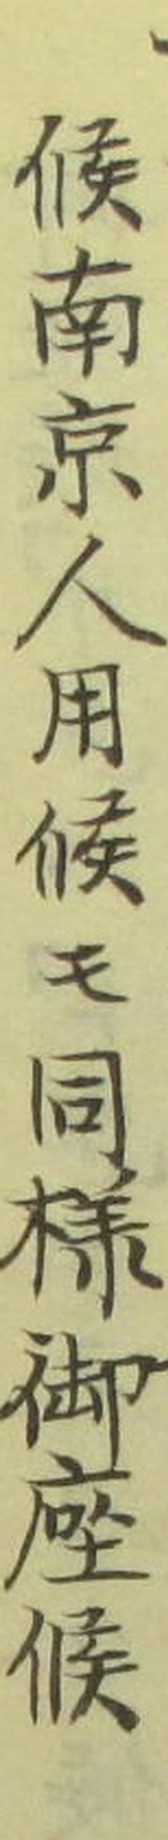候南京人用候モ同様御座候
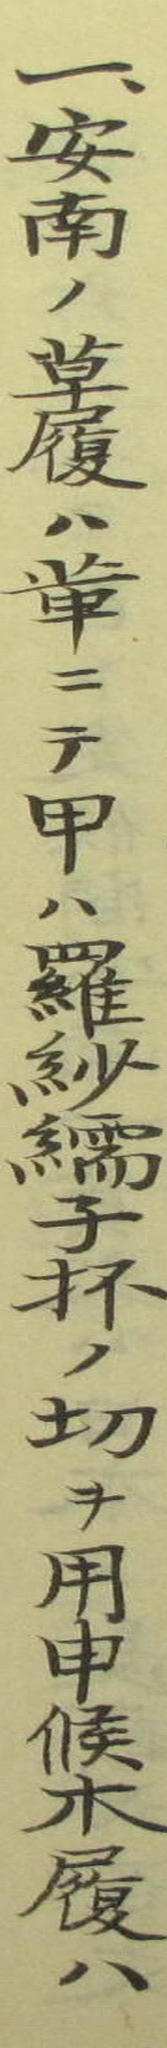一安南ノ草履ハ革ニテ甲ハ羅紗繻子抔ノ切ヲ用申候木履ハ
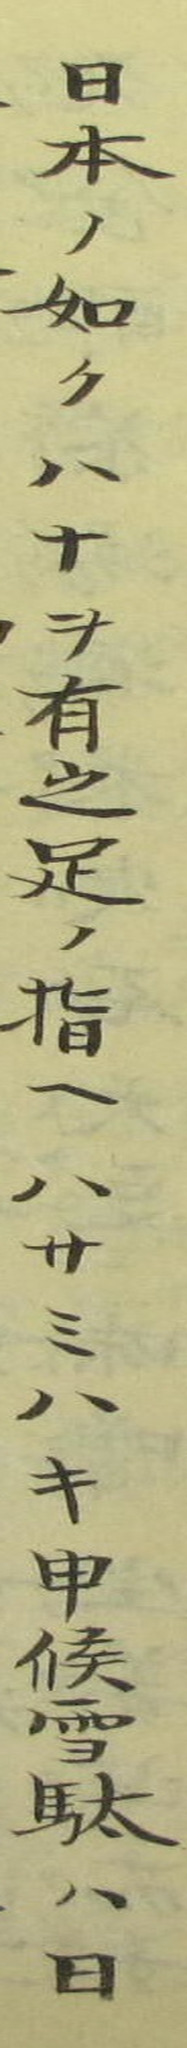日本ノ如クハナヲ有之足ノ指ヘハサミハキ申候雪駄ハ日
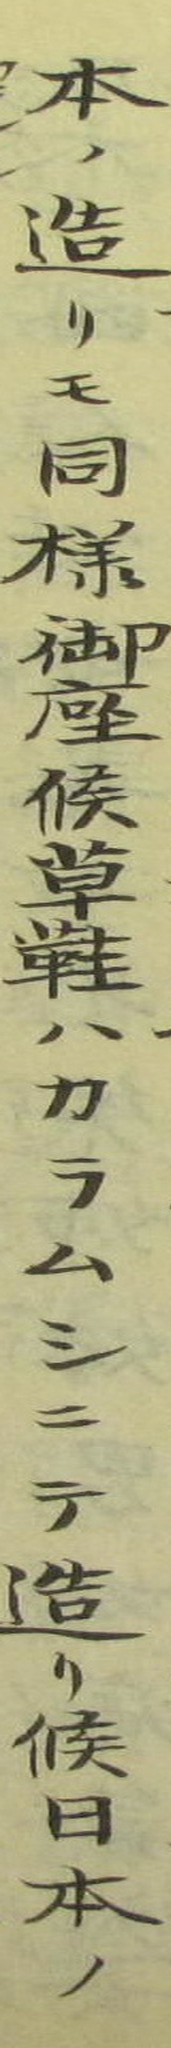本ノ造リモ同様御座候草鞋ハカラムシニテ造リ候日本ノ
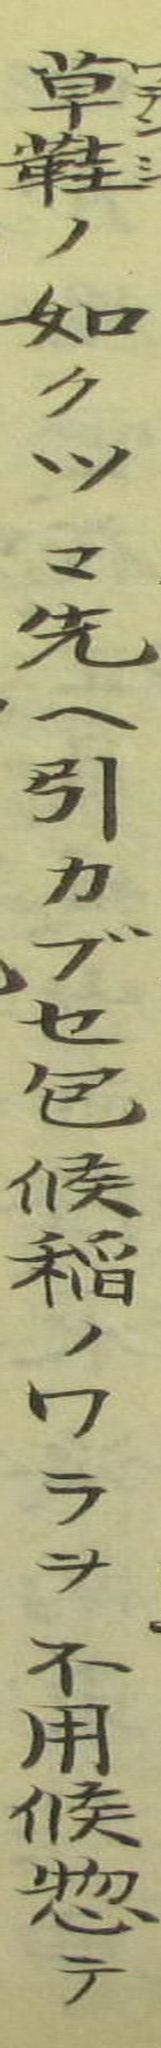草鞋ノ如クツマ先へ引カブセ包候稲ノワラヲ不用候惣テ
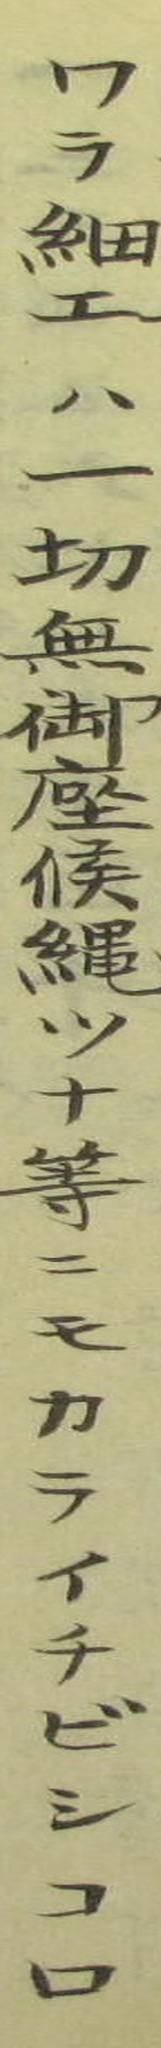ワラ細工ハ一切無御座候縄ツナ等二モカライチビシコロ
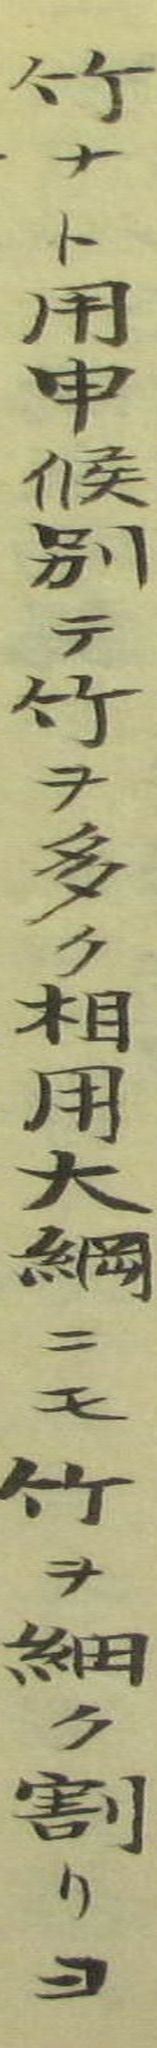竹ナト用申候別テ竹ヲ多ク相用大綱ニモ竹ヲ細ク割リヨ
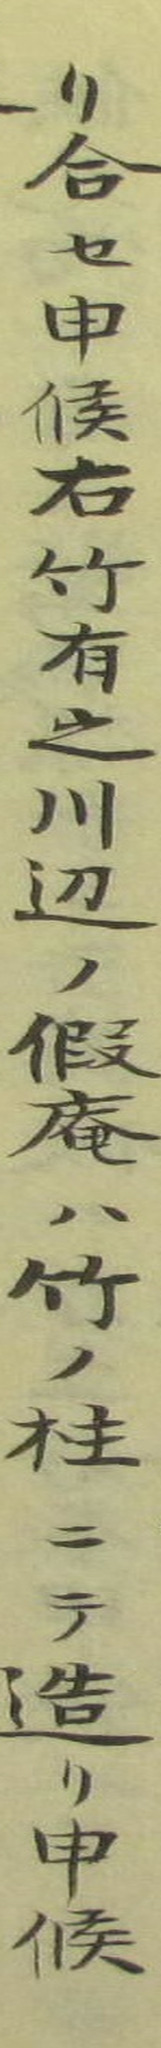リ合セ申候右竹有之川辺ノ假庵ハ竹ノ柱ニテ造リ申候
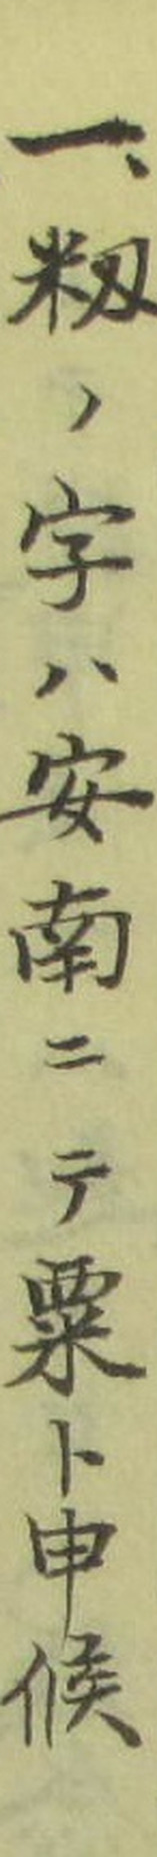一籾ノ字ハ安南ニテ粟ト申候
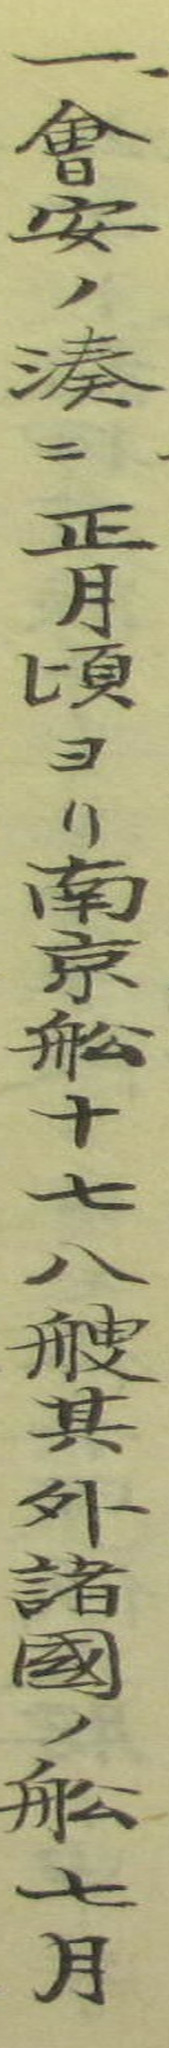一會安ノ湊ニ正月頃ヨリ南京舩十七八艘其外諸國ノ舩七月
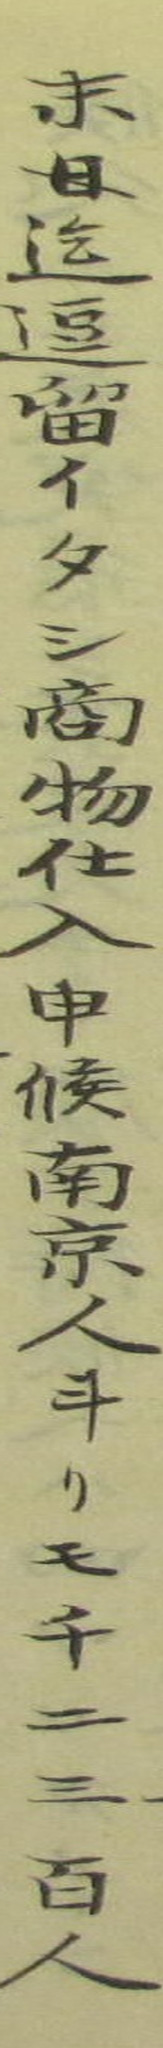末日迄逗留イタシ商物仕入申候南京人斗リモ千二三百人
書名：異国船漂着記 外二
